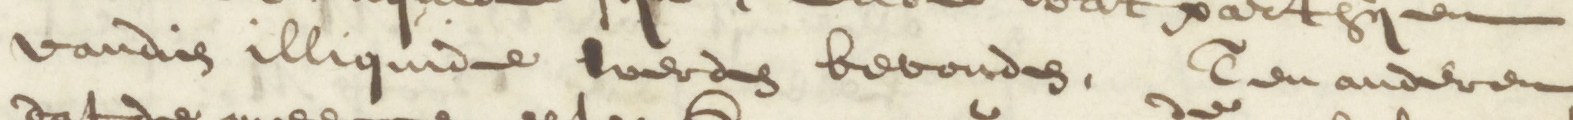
vandien illiquide werden bevonden. Ten anderen
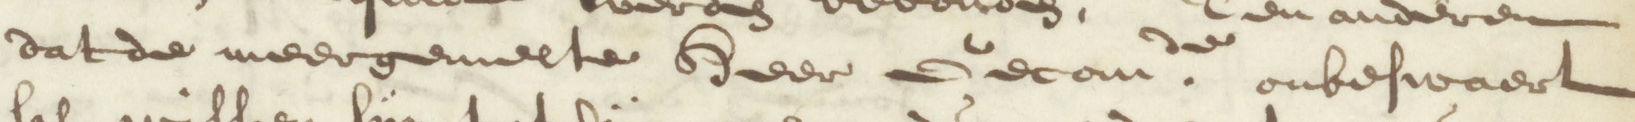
dat de meergemelte Heer Gecomde. onbeswaert
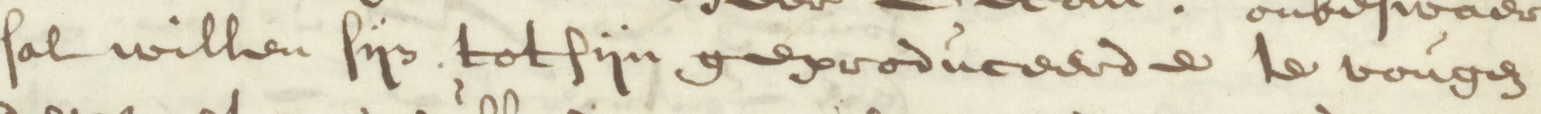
sal willen sijn tot sijn geproduceerde te vougen
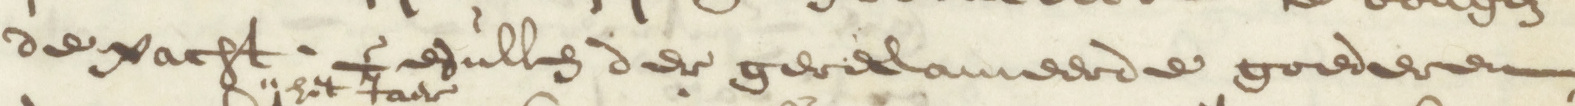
de pacht-cedullen der gereclameerde goederen
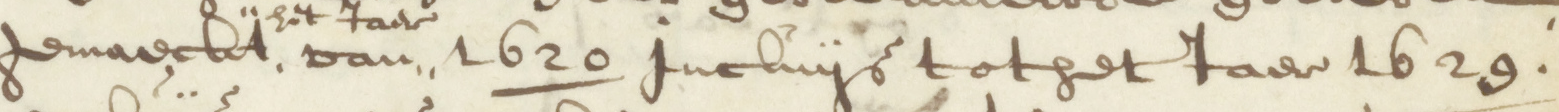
gemaeckt, van# het jaer 1620 Incluijs tot het Jaer 1629.
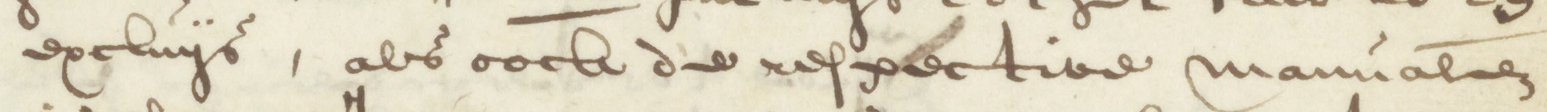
excluijs, als oock de respective manualen
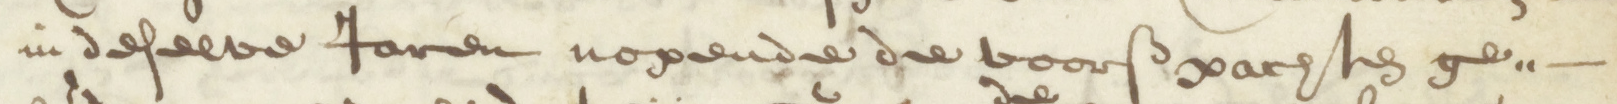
in deselve Jaren nopende de voors pachten ge„
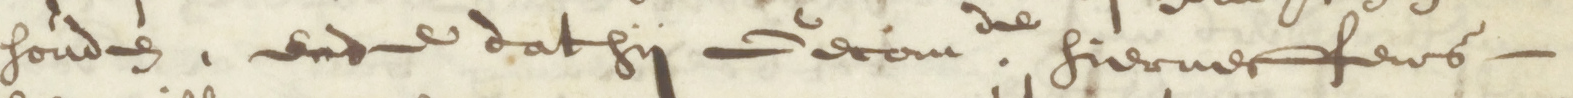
houden, ende dat hij Gecomde. hierneffens —
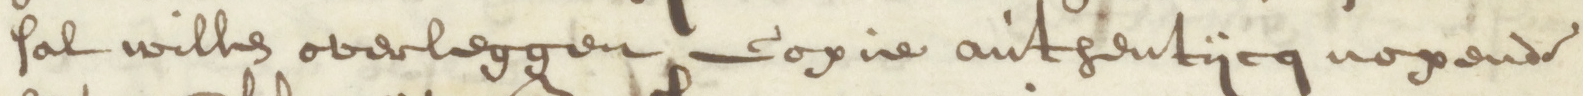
sal willen overleggen Copie authentijcq nopende
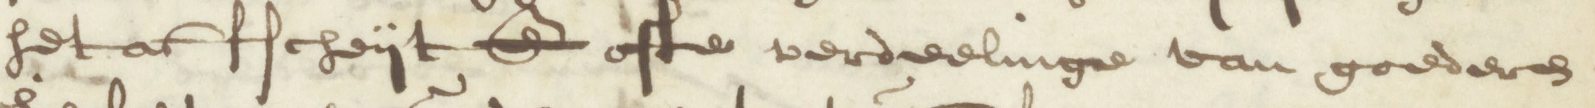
het affscheijt & ofte verdeelinge van goederen
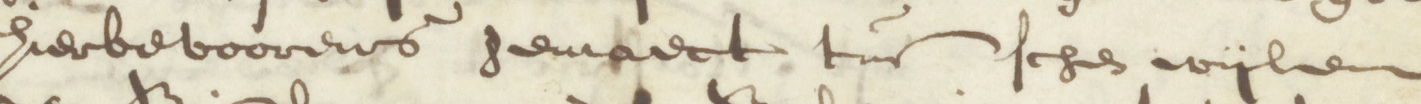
hierbevoorens gemaect tusschen wijlen
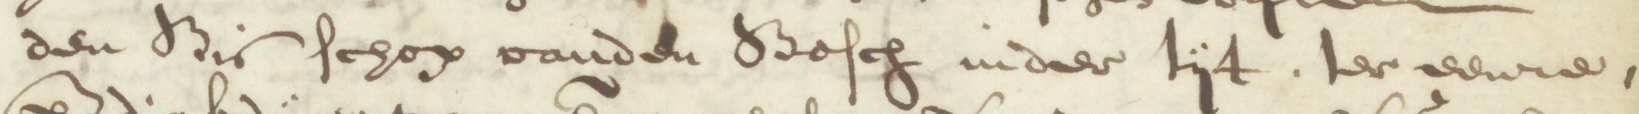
den Bisschop vanden Bosch inder tijt, ter eenre,
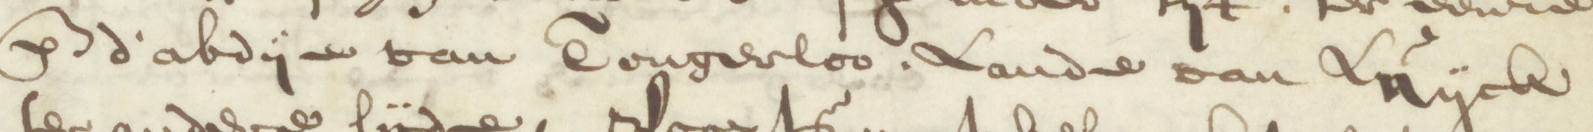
& d'abdije van Tongerloo, Lande van Luijck
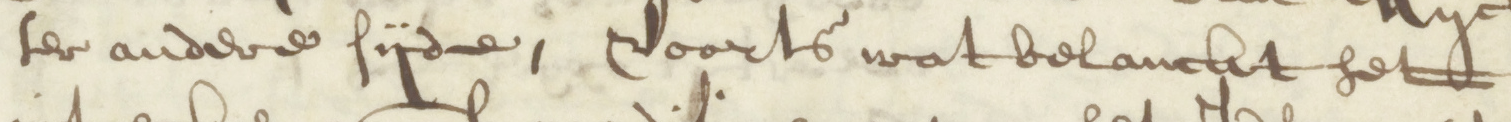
ter andere sijde. Voorts wat belanckt het
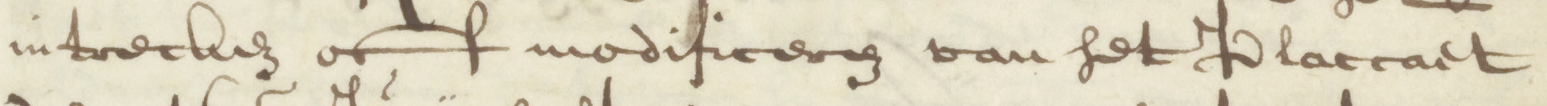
intrecken off modificeren van het Placcaet
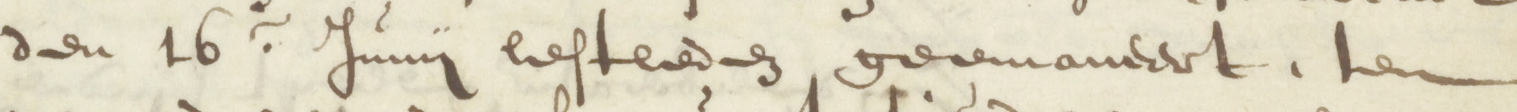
den 16e. Junij lestleden geemaneert, ten
